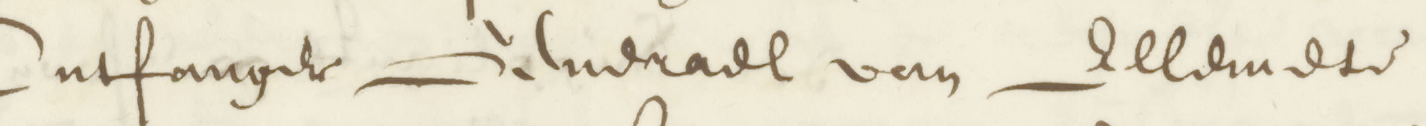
Ontfanger Generael van Ellemete
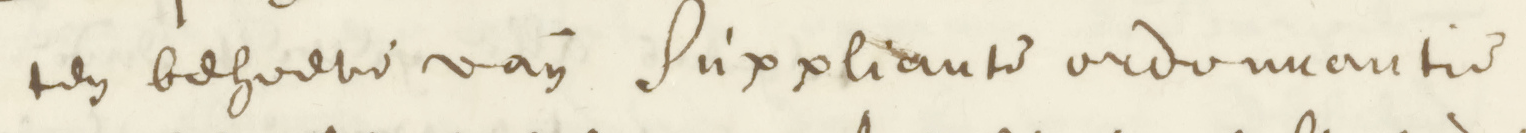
ten behoeve van Suppliante ordonnantie
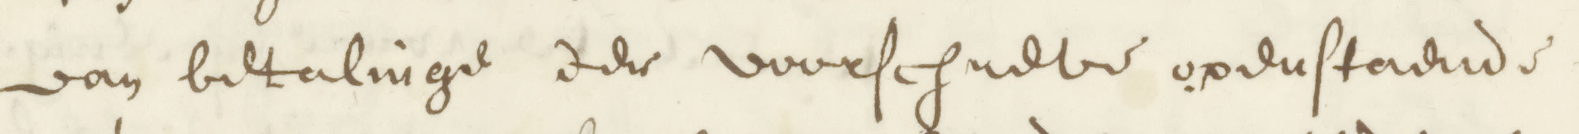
van betalinge der voorschreve openstaende
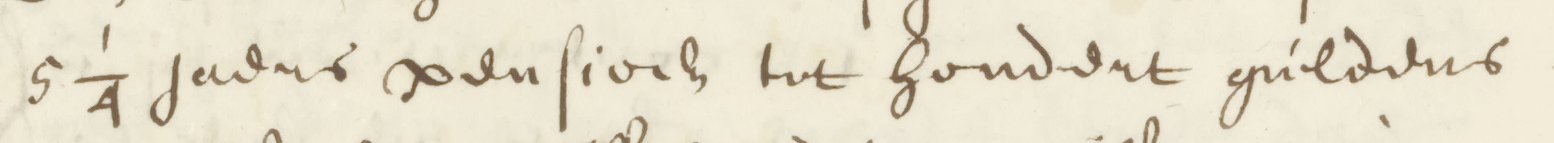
5¼ jaers pensioen tot hondert guldens
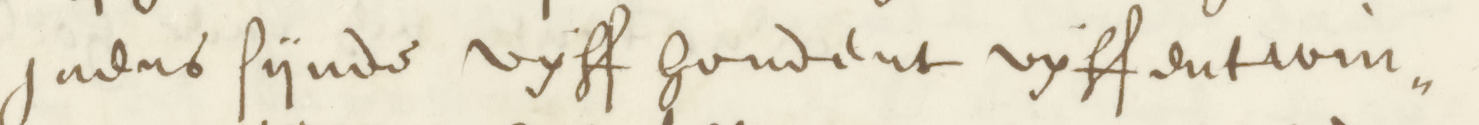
jaers sijnde vijff hondert vijffentwin,,
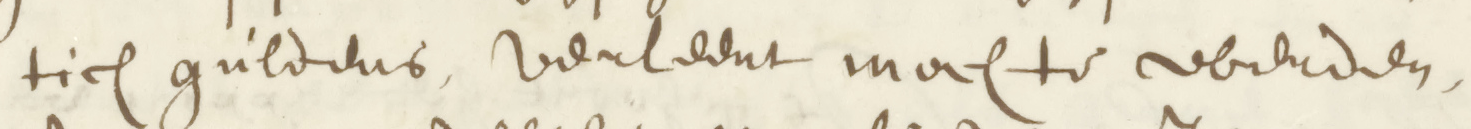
tich guldens verleent mochte werden.
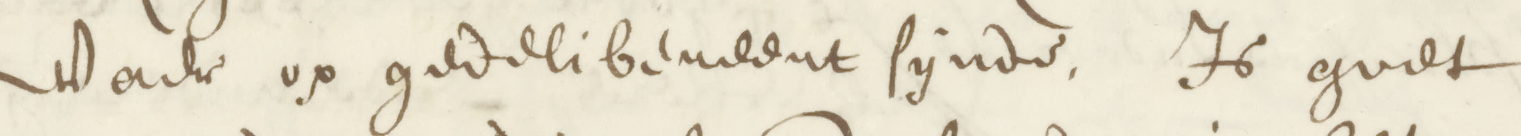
Waer op gedelibereert sijnde, Is goet
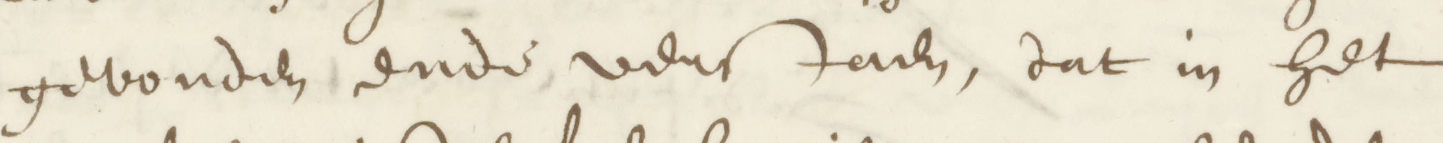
gevonden ende verstaen, dat in het
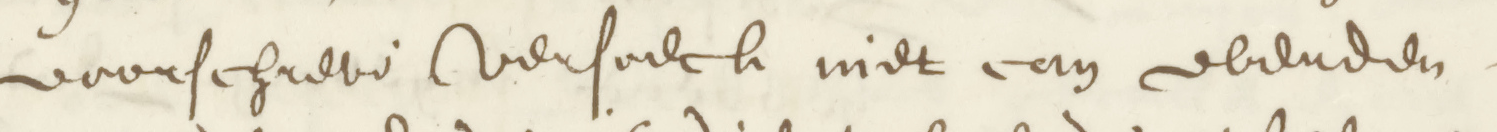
voorschreve versoeck niet can werden
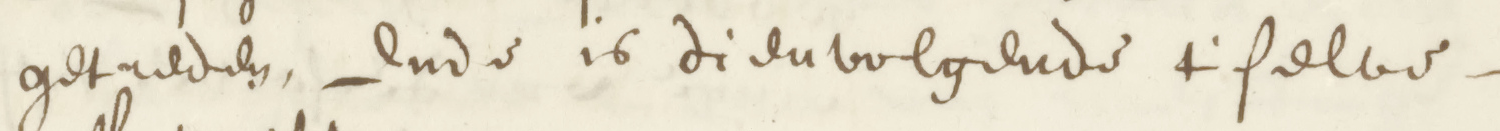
getreden, ende is dienvolgende t'selve
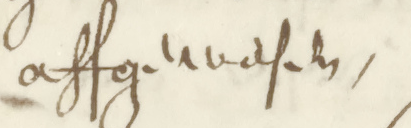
affgewesen.
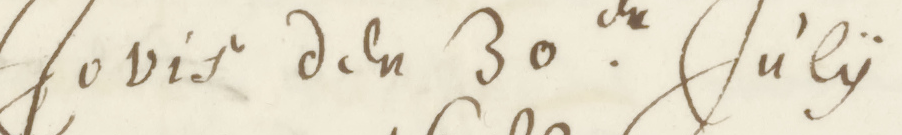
Jovis den 30en. Julij
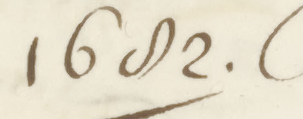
1682.
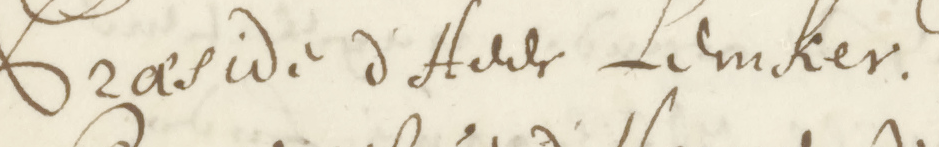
Præside d' Heer Lemker.
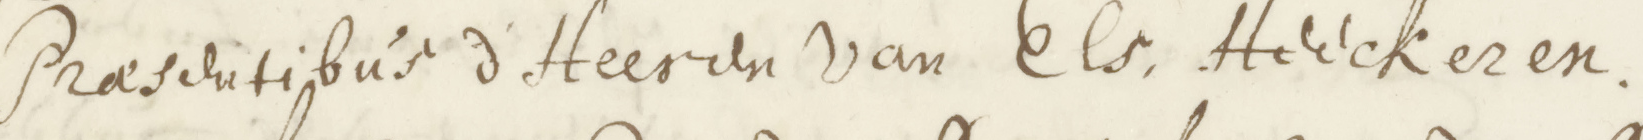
Præsentibus d'Heeren van Els, Heeckeren,
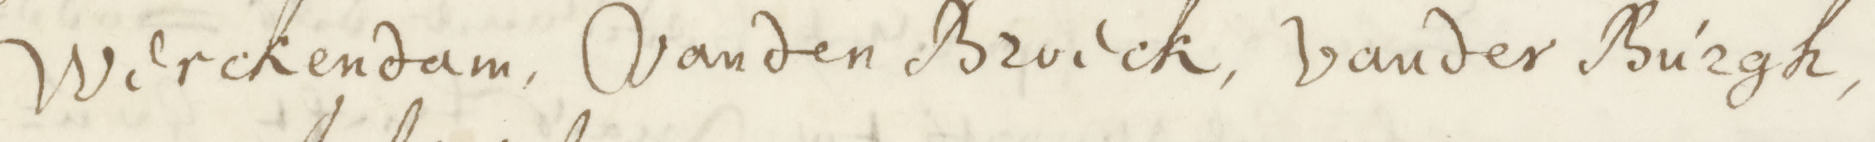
Werckendam, Van den Broeck, van der Burgh,
